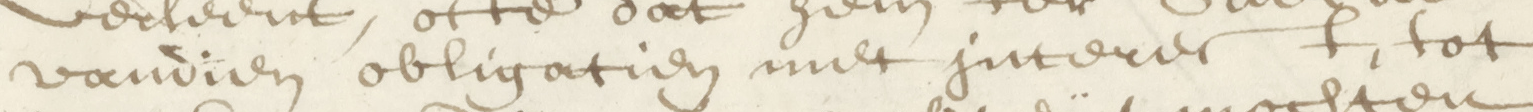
vandien obligatien met interest, tot
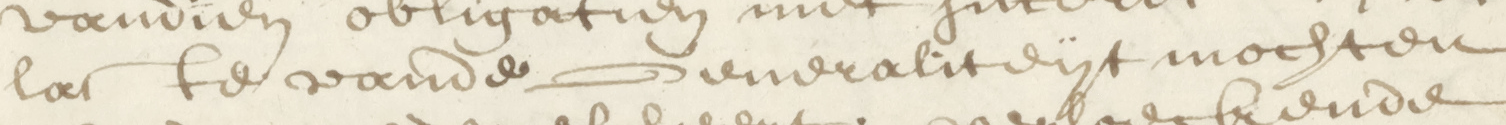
laste vande Generaliteijt mochten
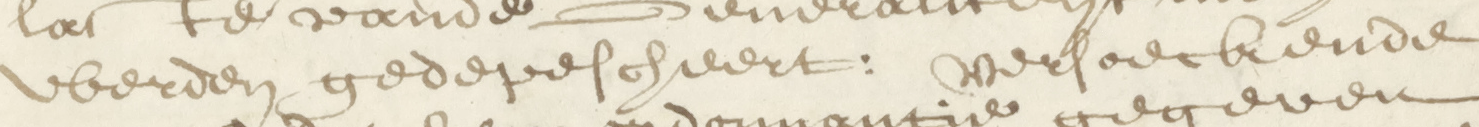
werden gedespecheert: versoeckende
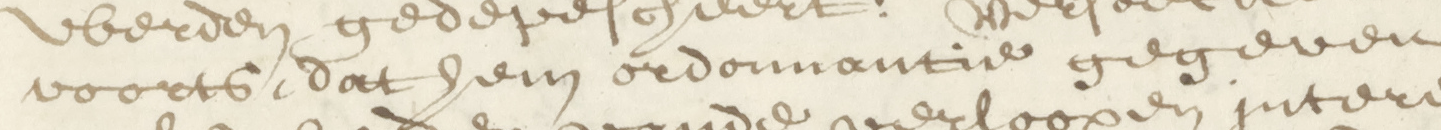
voorts dat hem ordonnantie gegeven
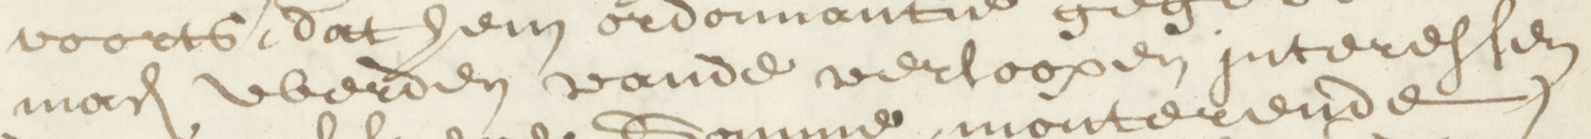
mach werden vande verloopen interessen
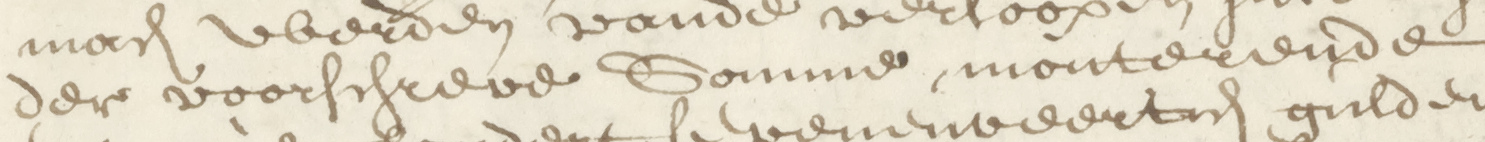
der voorschreve Somme, monterende
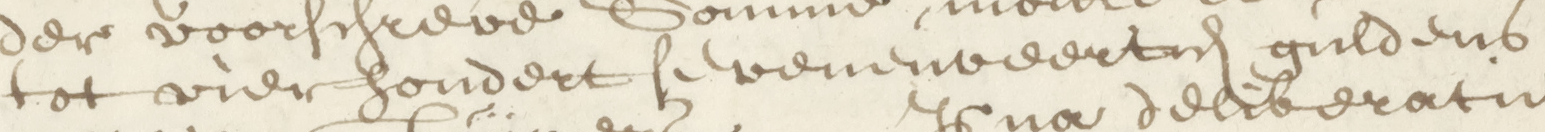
tot vier hondert sevenenveertich guldens
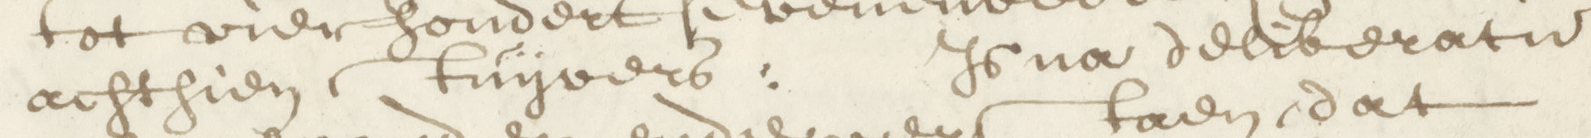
achthien stuijvers: Is na deliberatie
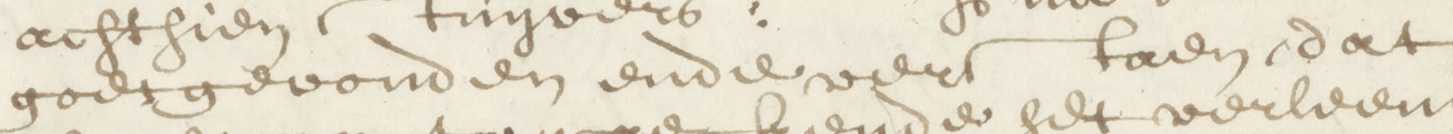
goetgevonden ende verstaen, dat
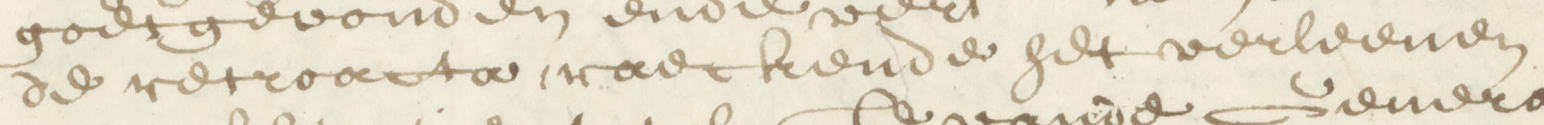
de retroacta raeckende het verleenen
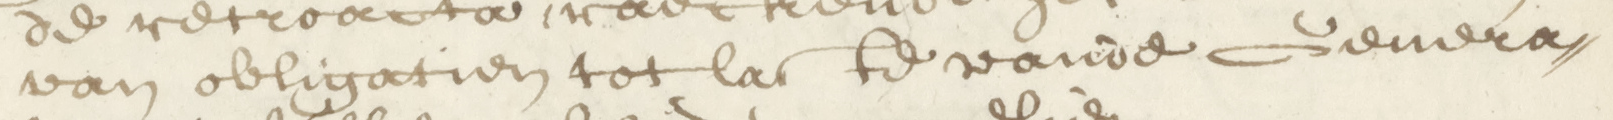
van obligatien tot laste vande Genera„
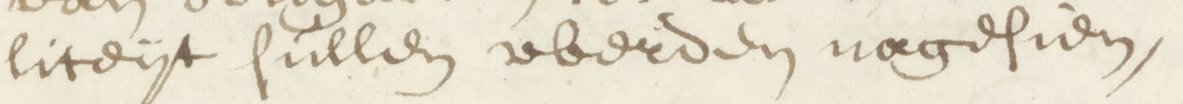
liteijt sullen werden nagesien.
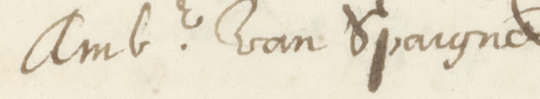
Ambr. van Spaigne
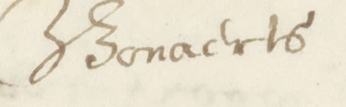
Bonaerts
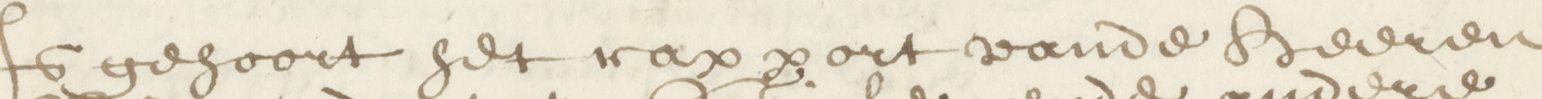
Is gehoort het rapport vande heeren
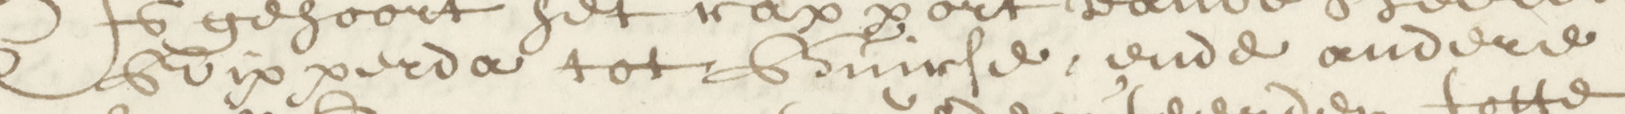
Ripperda tot Buirse, ende andere
